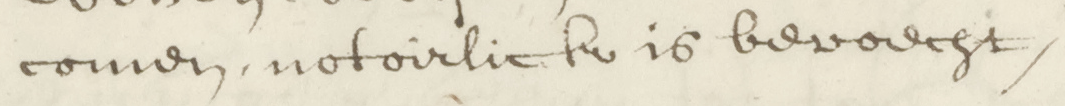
comen, notoirlick is bevoecht.
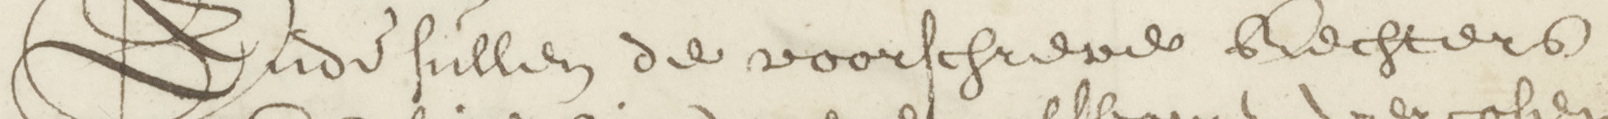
Ende sullen de voorschreve Rechters
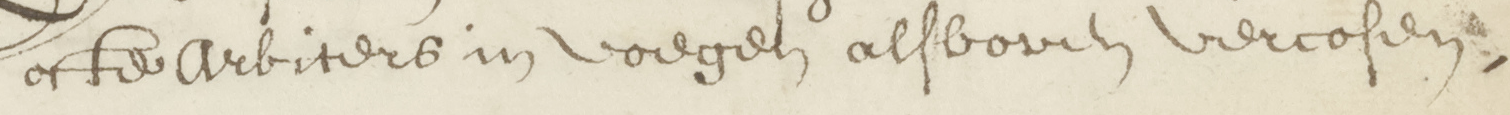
ofte Arbiters in voegen als boven vercosen
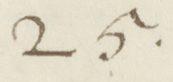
25.
